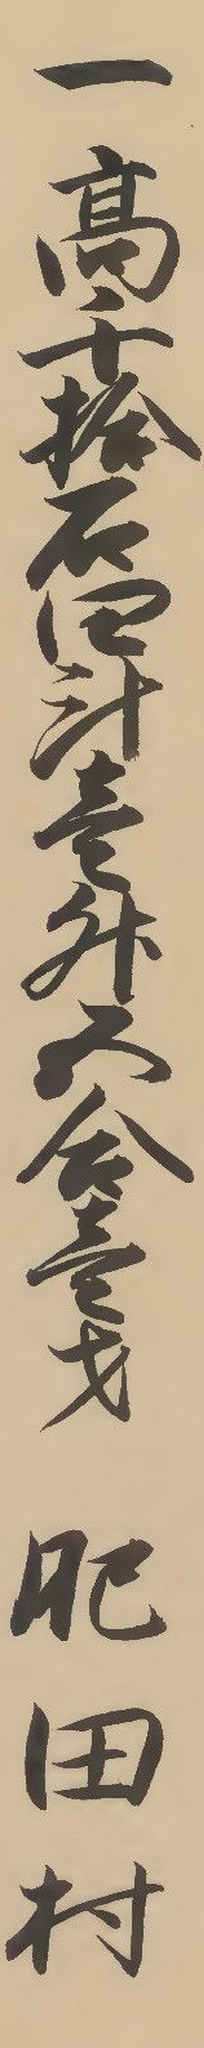一高千拾石四斗壱升五合壱才肥田村
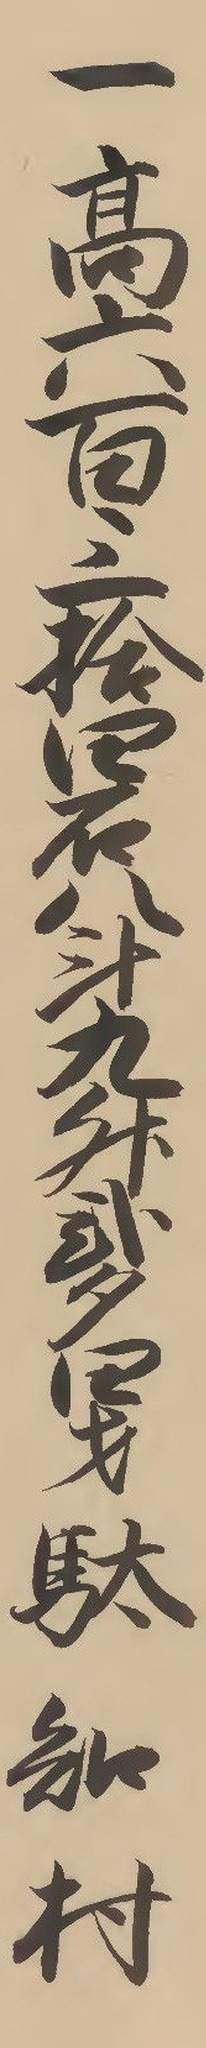一高六百三拾四石八斗九升弐勺四才駄知村
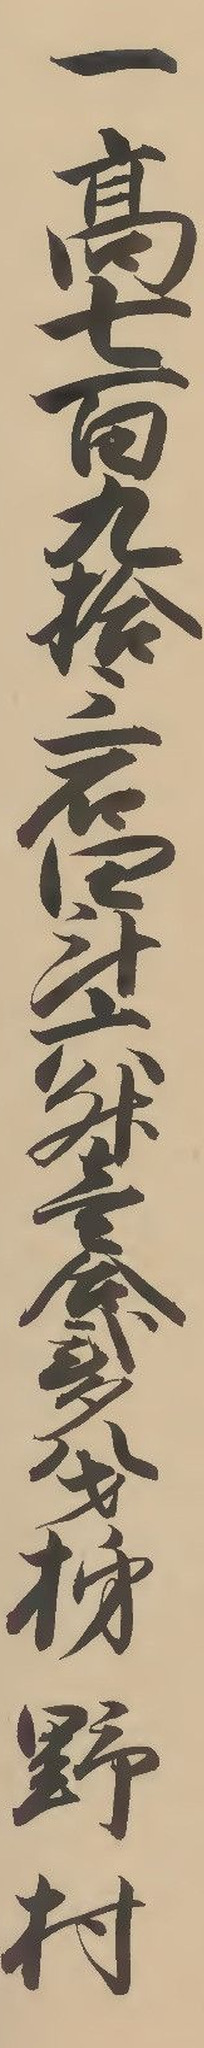一高七百九拾三石四斗六升壱合弐勺八才柿野村
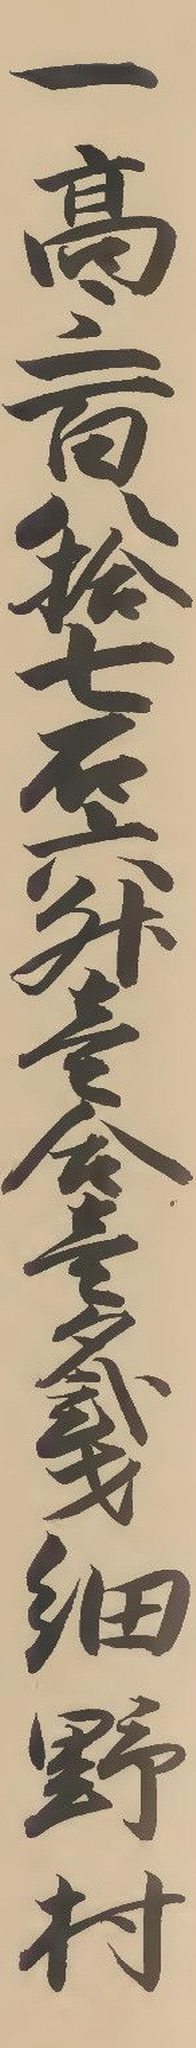一高三百八拾七石六升壱合壱勺弐才細野村
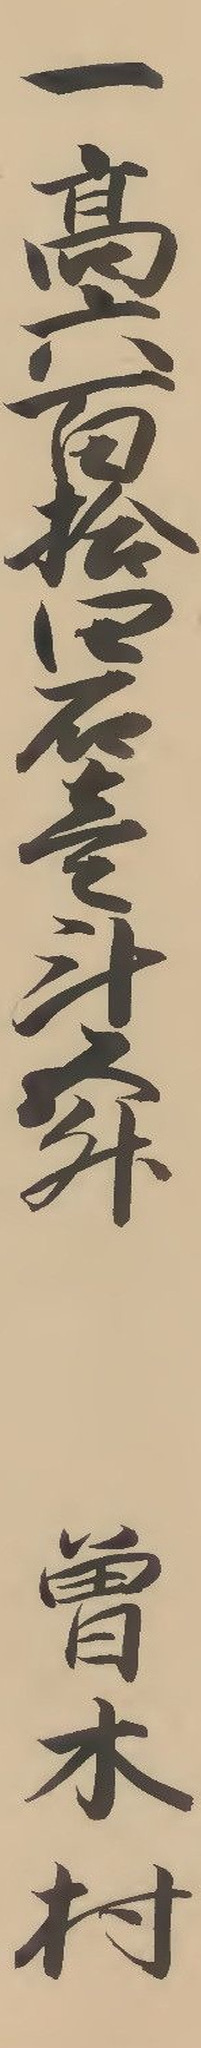一高六百拾四石壱斗五升曽木村
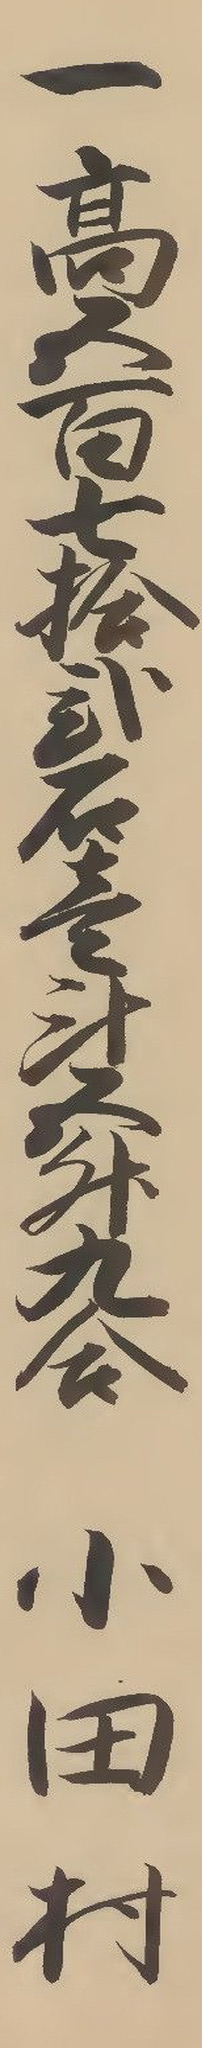一高五百七拾弐石壱斗五升九合小田村
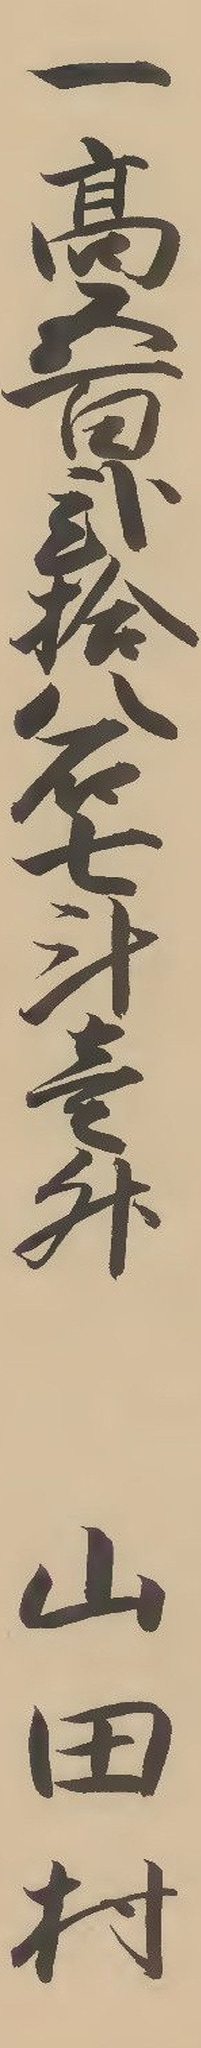一高五百弐拾八石七斗壱升山田村

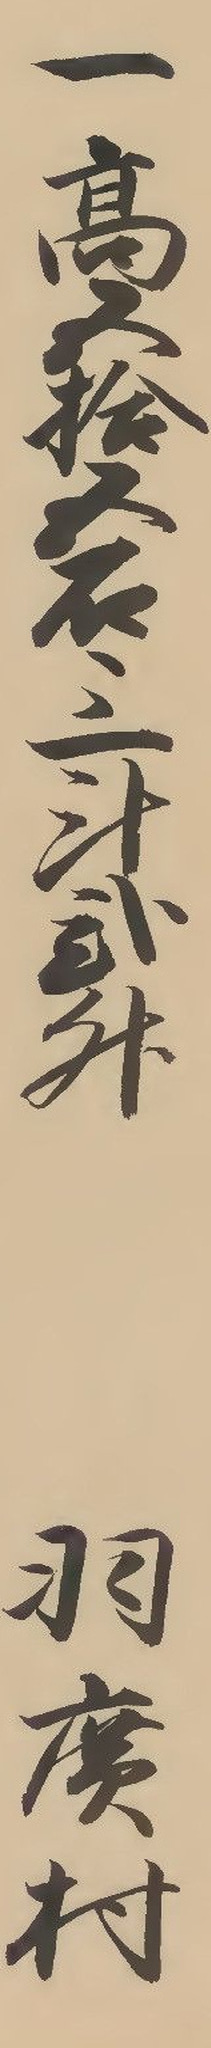一高五拾五石三斗弐升羽広村
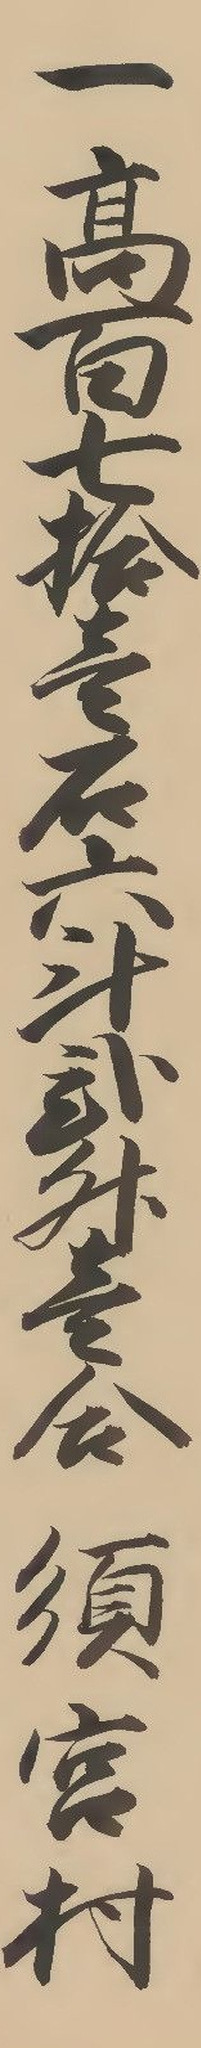一高百七拾壱石六斗弐升壱合須宮村
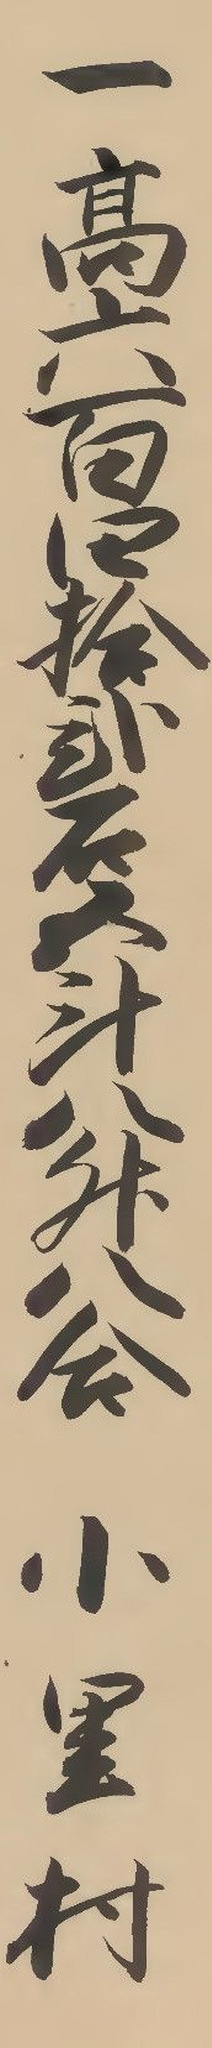一高六百四拾弐石五斗八升八合小里村
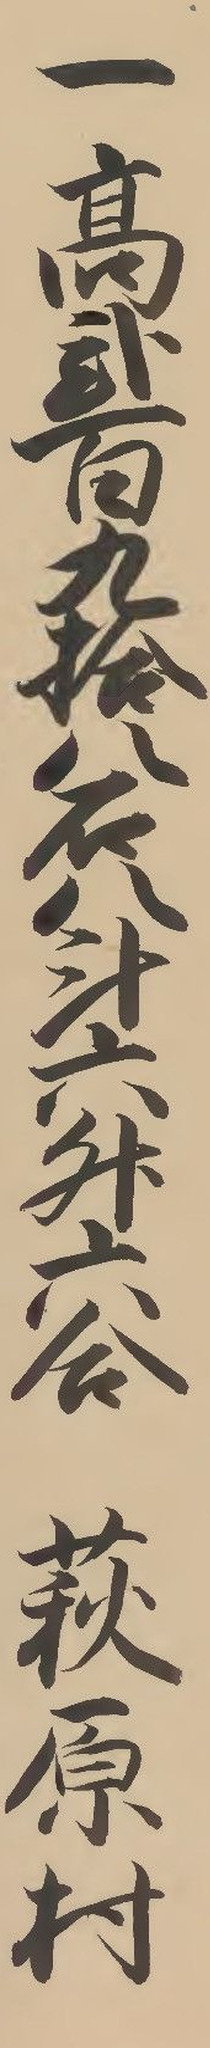一高弐百九拾八石八斗六升六合萩原村
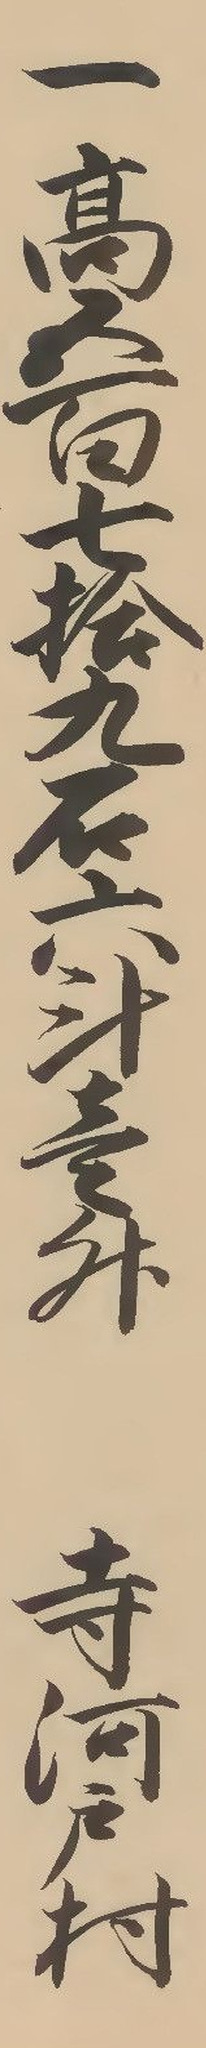一高五百七拾九石六斗壱升寺河戸村
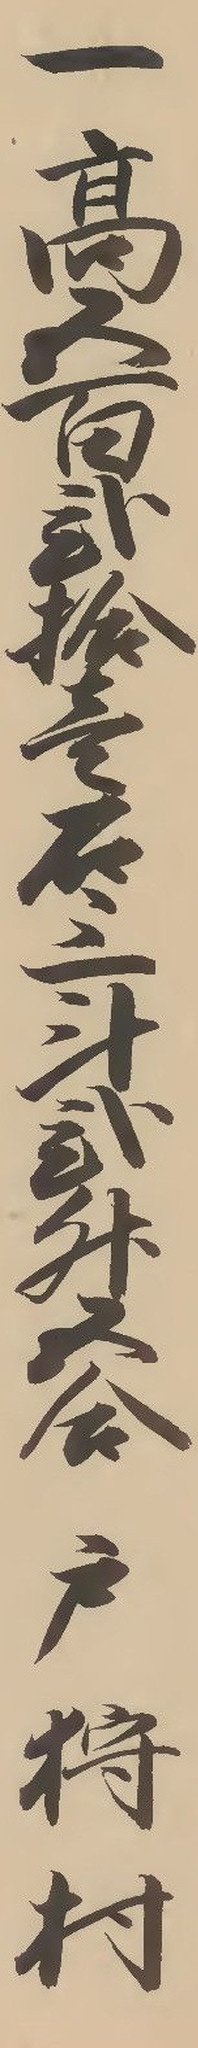一高五百弐拾壱石三斗弐升五合戸狩村
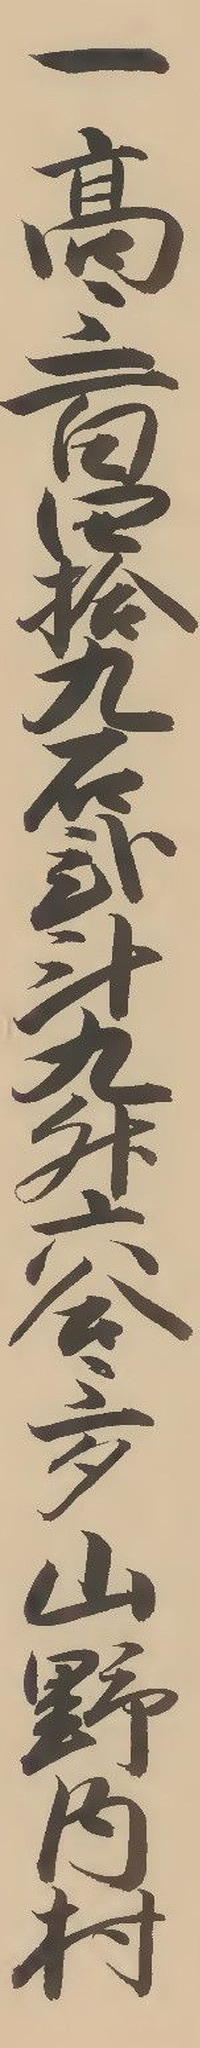一高三百四拾九石弐斗九升六合三勺山野内村

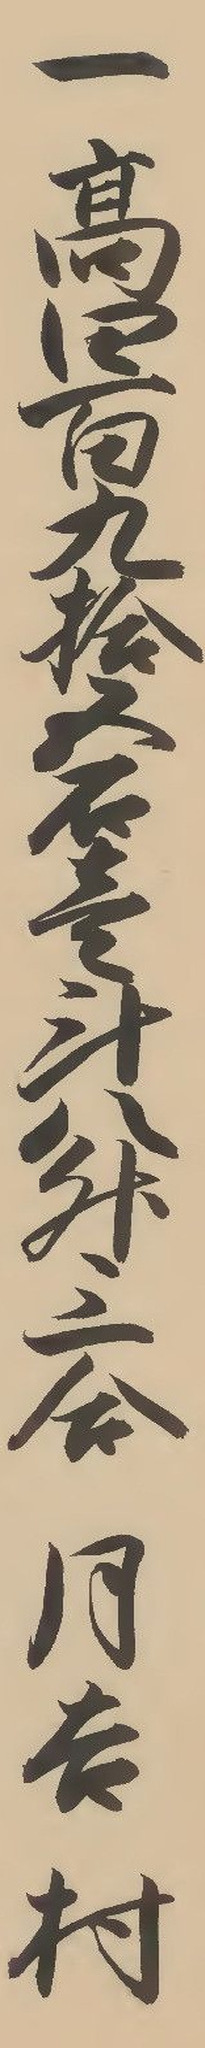一高四百九拾五石壱斗八升三合月吉村
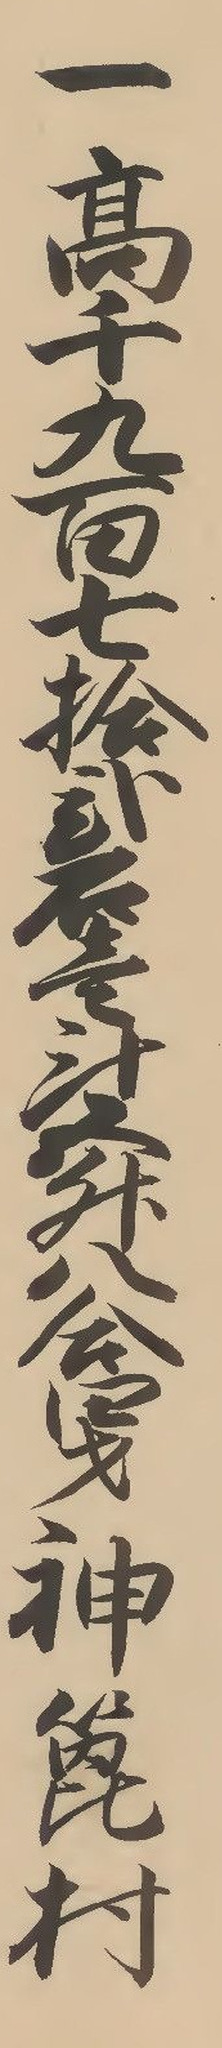一高千九百七拾弐石壱斗五升八合四才神箆村
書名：美濃国郷帳
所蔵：国立公文書館 National Archives of Japan
